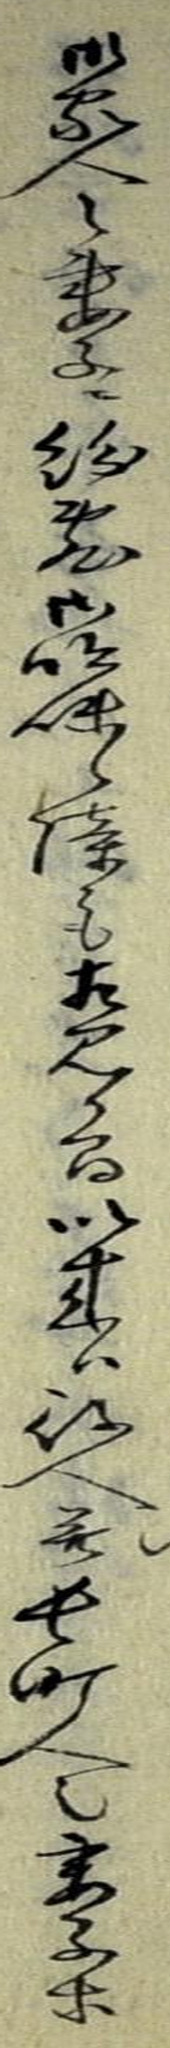御家人之妻子に紛敷御吟味之障にも相見候間以来は役人并長町人之妻子等
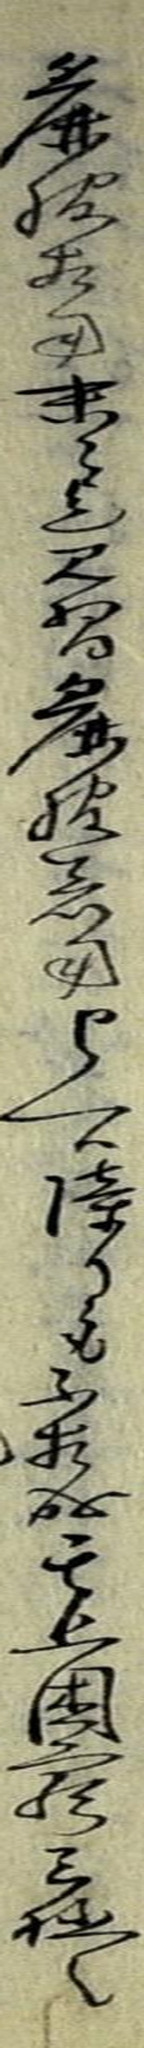麁服相用末々迄見習麁服着用申候へは障りにも不相成其上困窮至極之
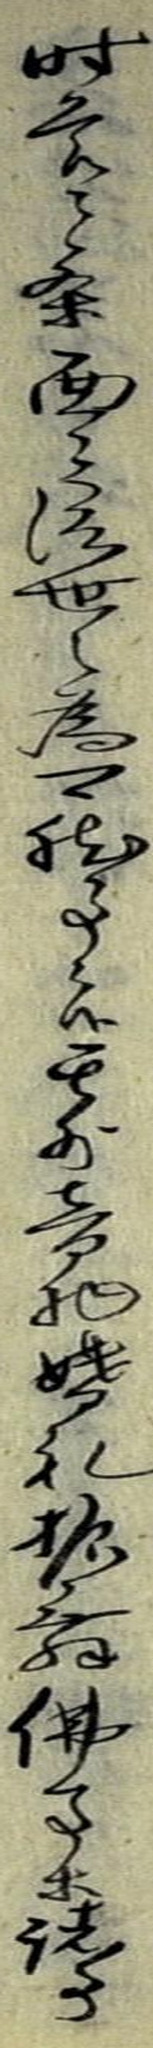時節に候条面々渡世之為可然事に候其外音物婚礼振舞仏事等諸事
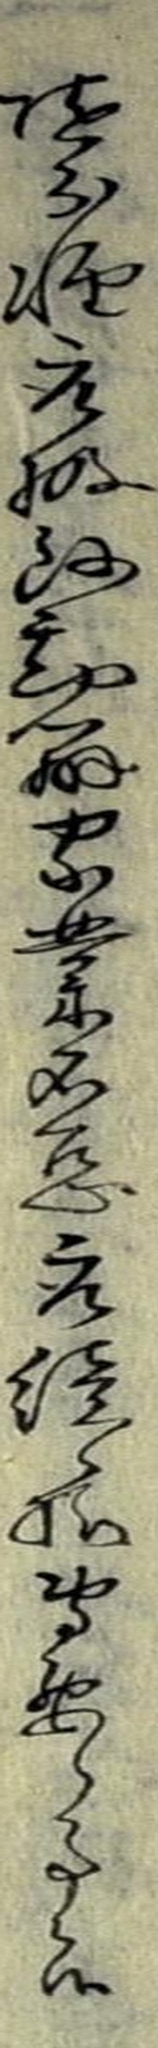随分軽取扱致勘弁家業不怠取続候様専要之事に候
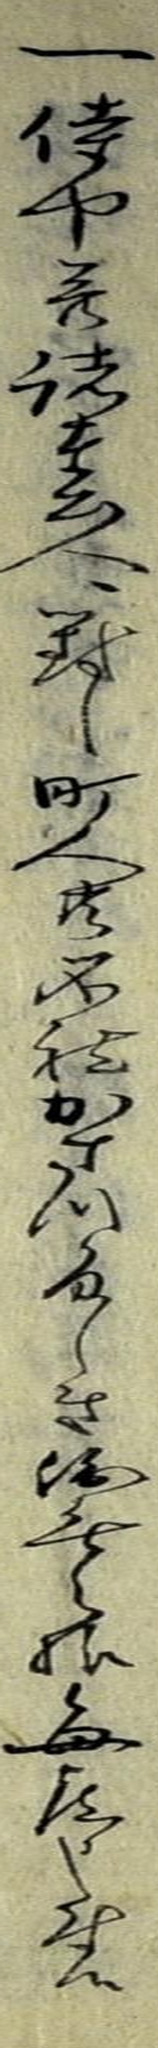一侍中并諸奉公人へ対し町人共不礼かさつかましき儀無之様毎度申付候
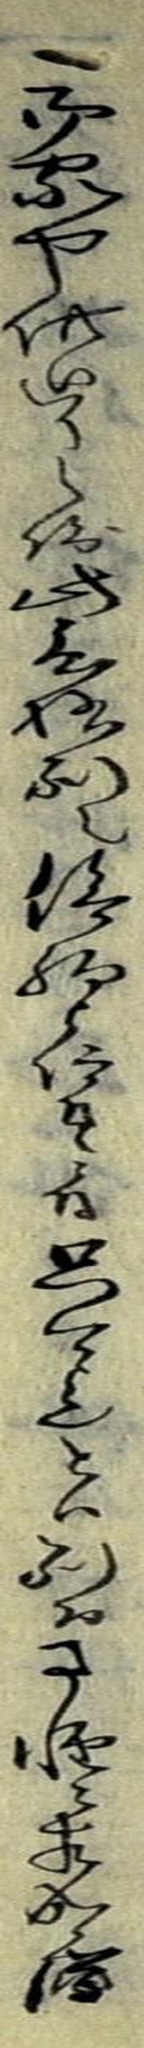御家中供廻り之儀此度格別之倹約被仰付候に付只今迄とは別而事軽に相成候得
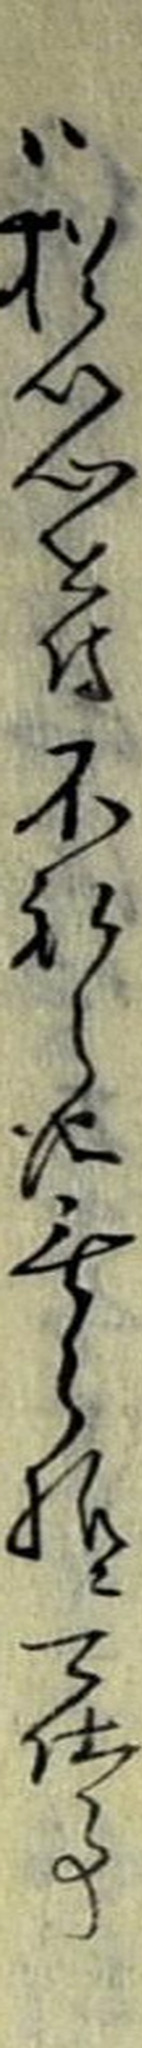は猶以心を付不礼之儀無之様に可仕事
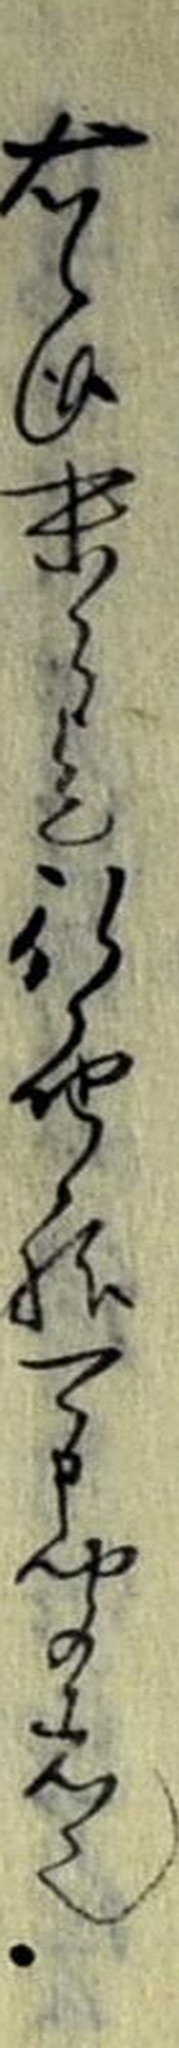右之趣末々迄行届候様可申聞者也

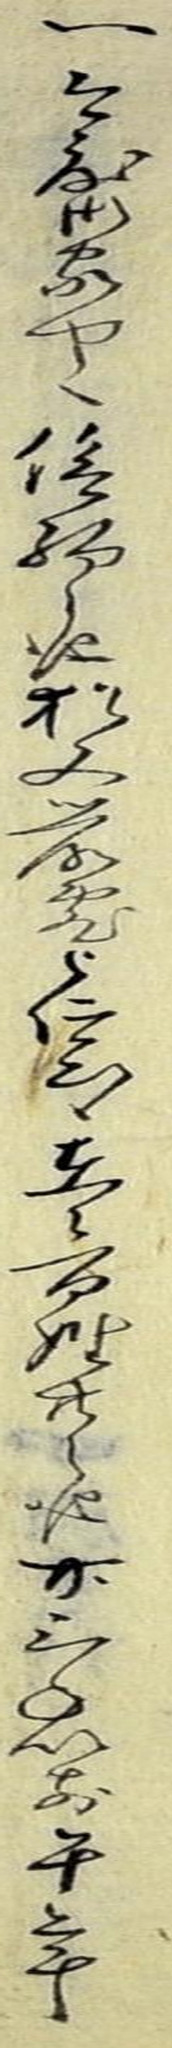一今度御家中へ倹約之儀猶又厳敷被仰出候在々百姓共之儀廿三年以前午年
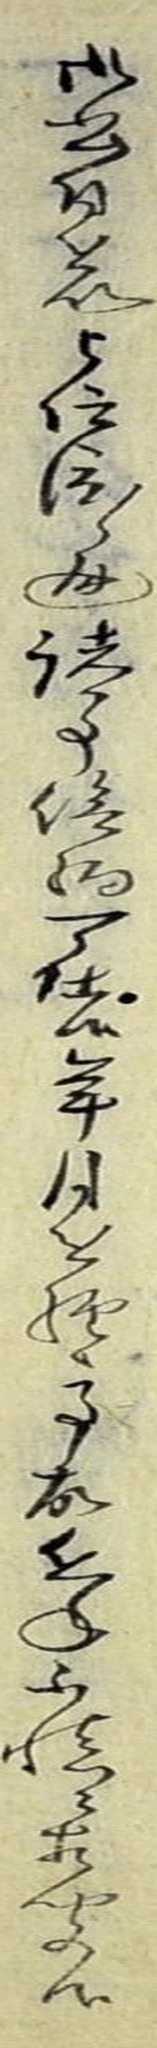御書付を以被仰渡候通諸事倹約可仕候年月を経候事故近年不慎に相聞候
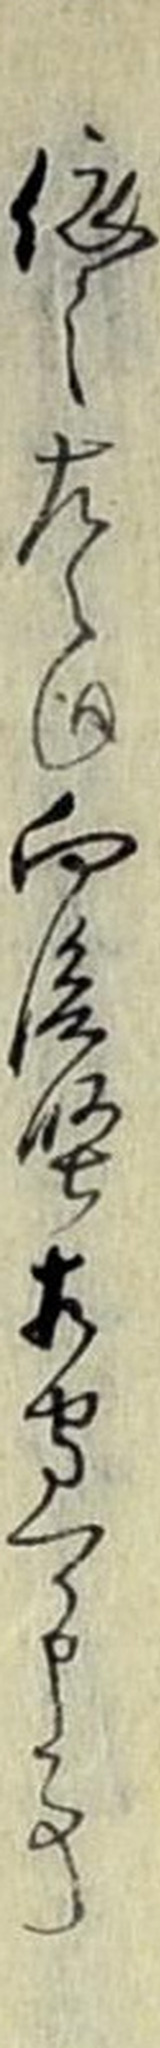依之左之趣向後堅相守可申事
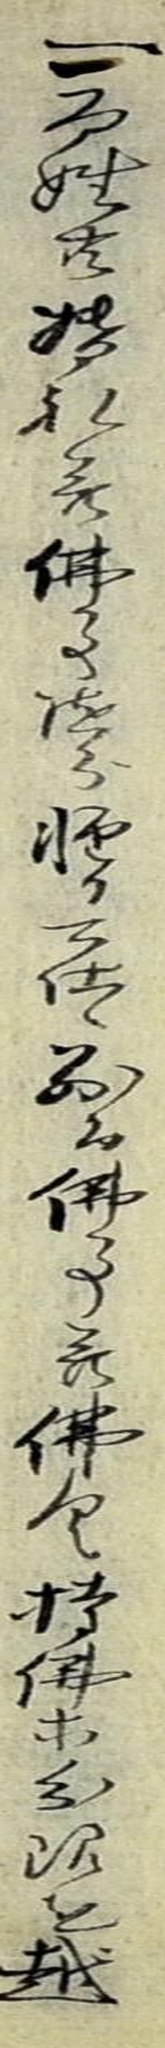一百姓共婚礼并仏事随分軽く可仕候別而仏事并仏具持仏等分限を越
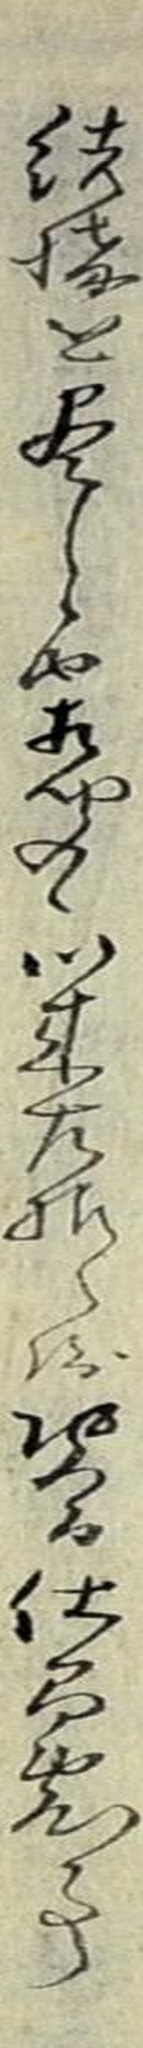結構を尽し候由相聞候以来左様之儀決而仕間敷事
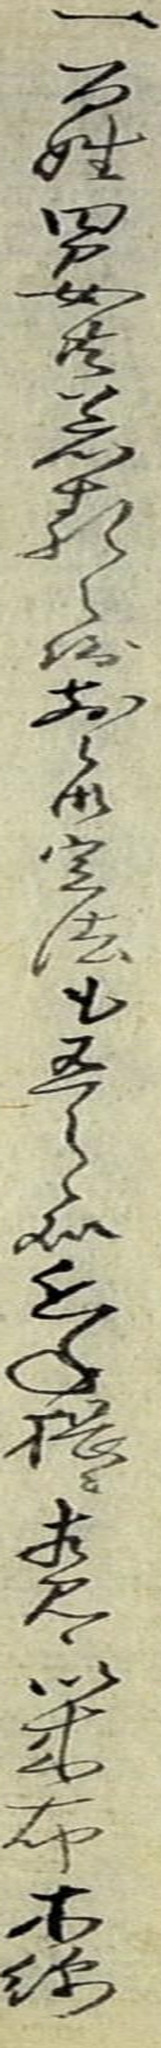一百姓男女共着類之儀前之御定法も有之候処近年猥に相見候以来布木綿
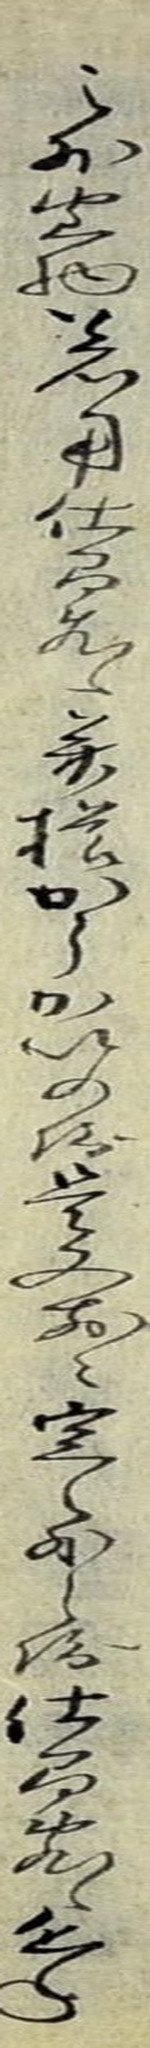之外宜物着用仕間敷候并櫛かうかいの儀是又前に定之外之儀仕間敷候近年
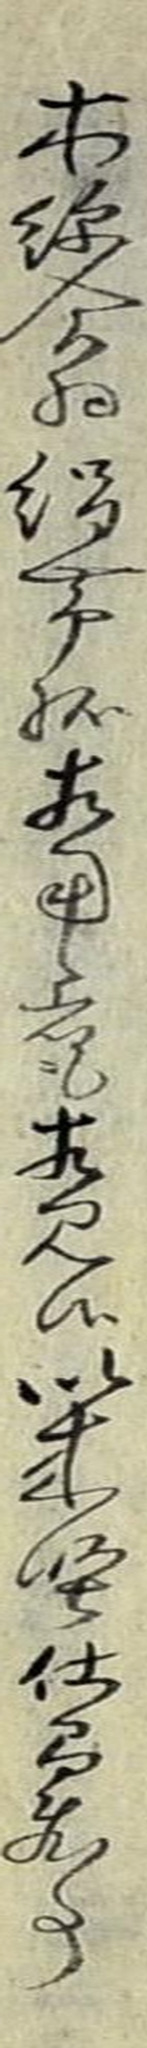木綿合羽絹帯抔相用候者も相見候以来堅仕間敷事
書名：命令之部 二
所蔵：福井県文書館 Fukui Prefectural Archives
